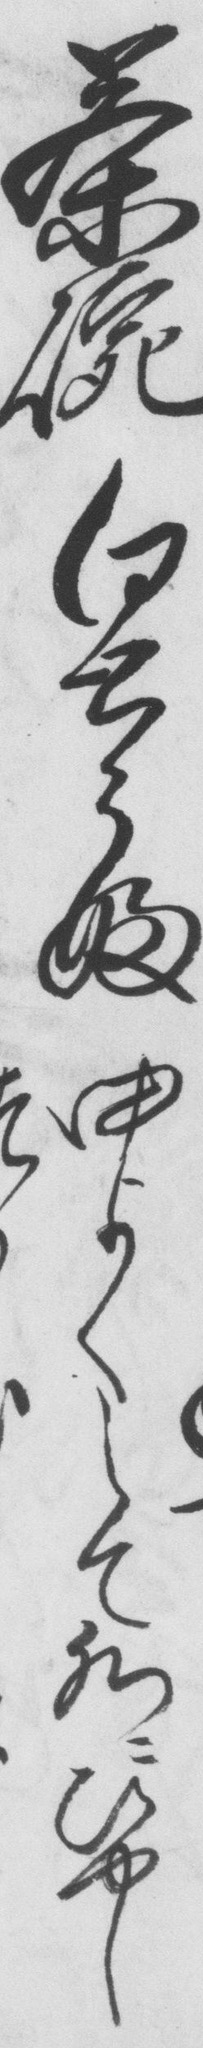茶碗白とうふゆよくして水ニひやし
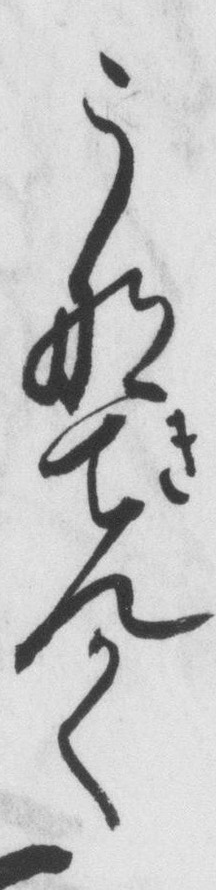うきでんかく
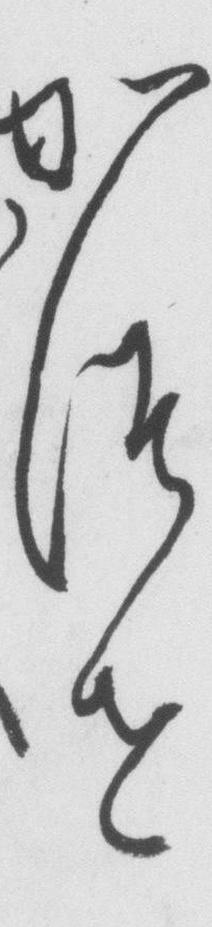かつを
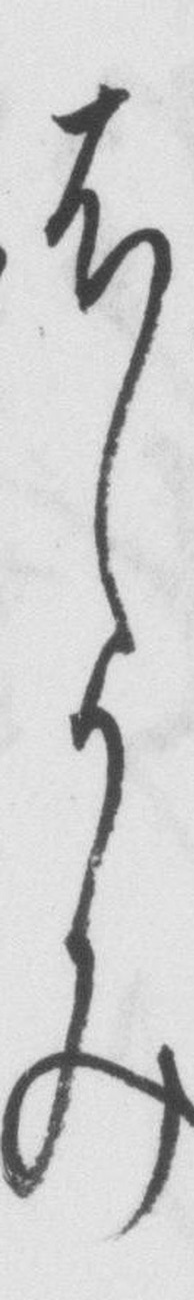はしかみ
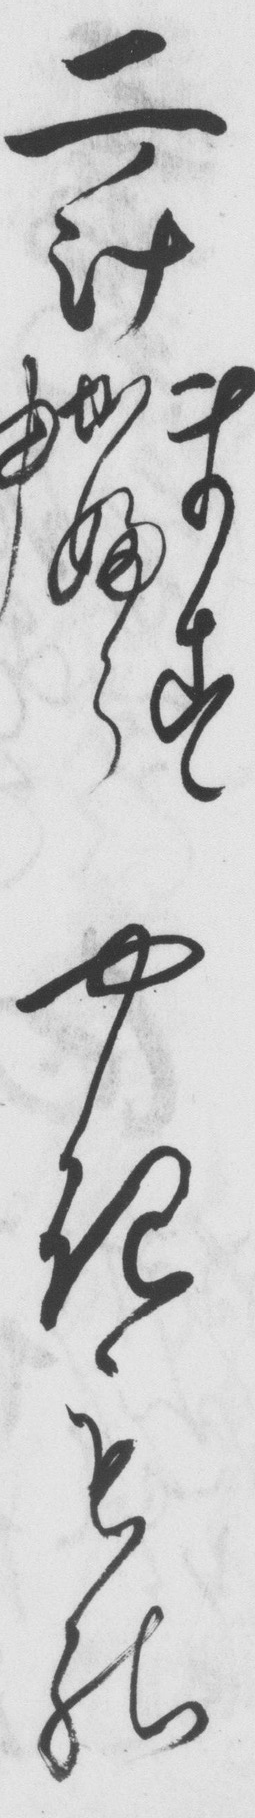二ノ汁かふらやきもの

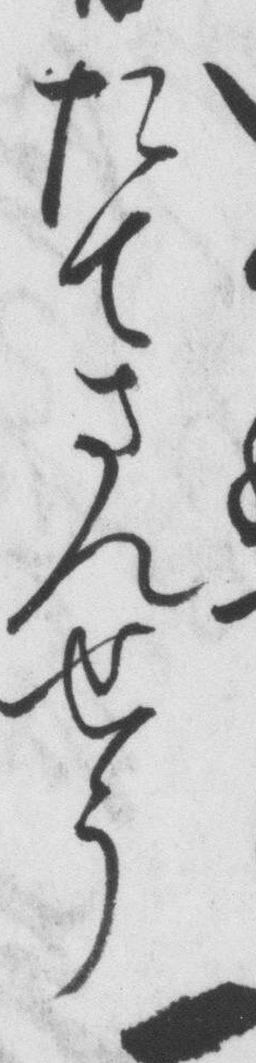たてさんせう
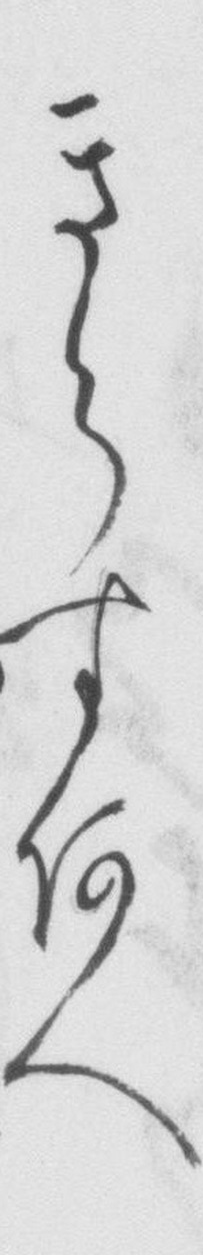きらすあへ
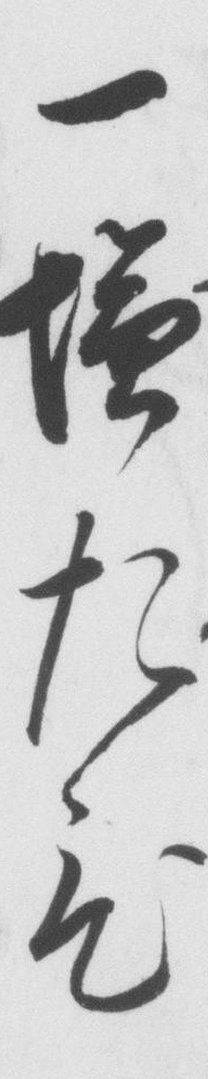一塩たひ
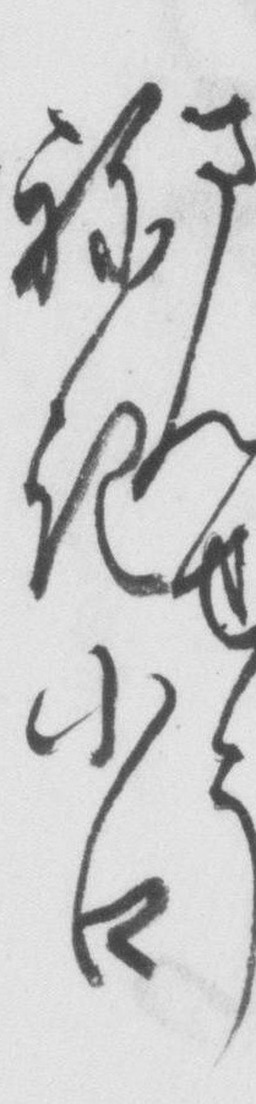ねき小口
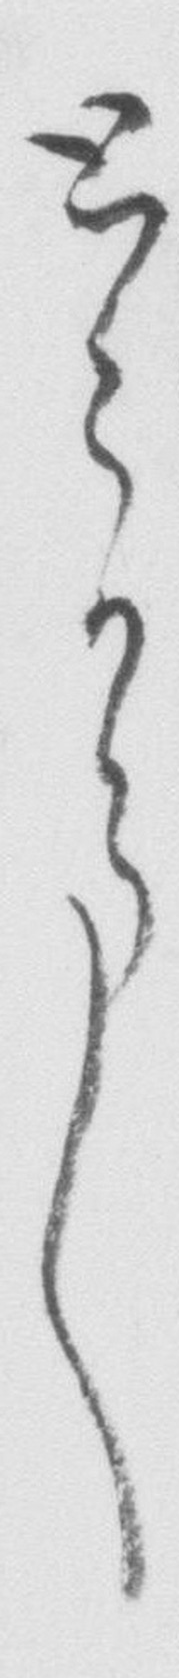とうからし

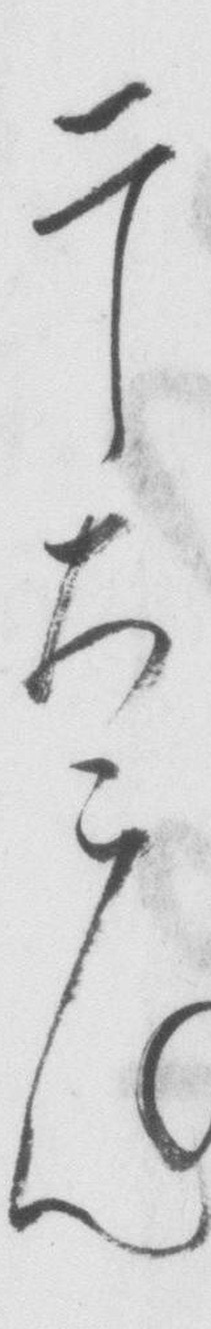干大こん
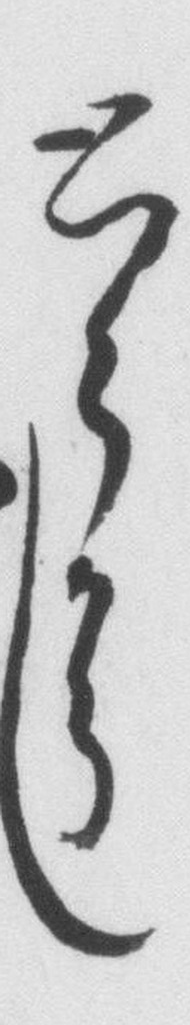とうからし
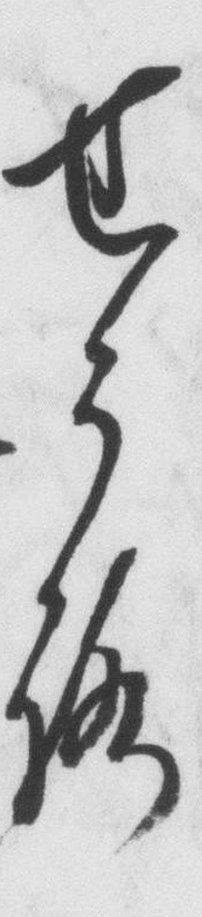せうろ
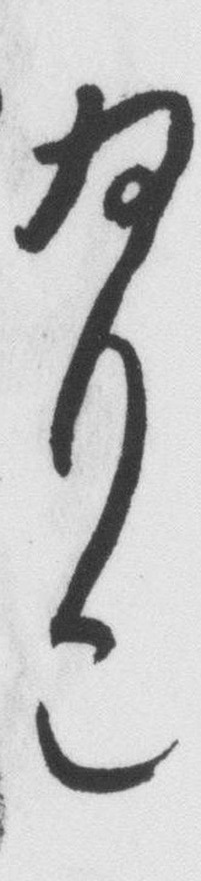いりこ
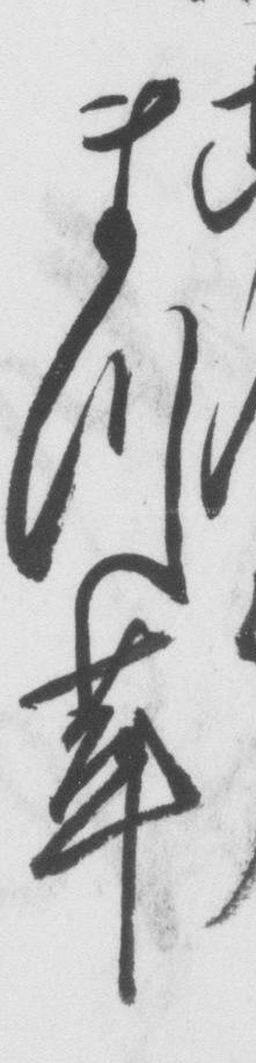まつ茸
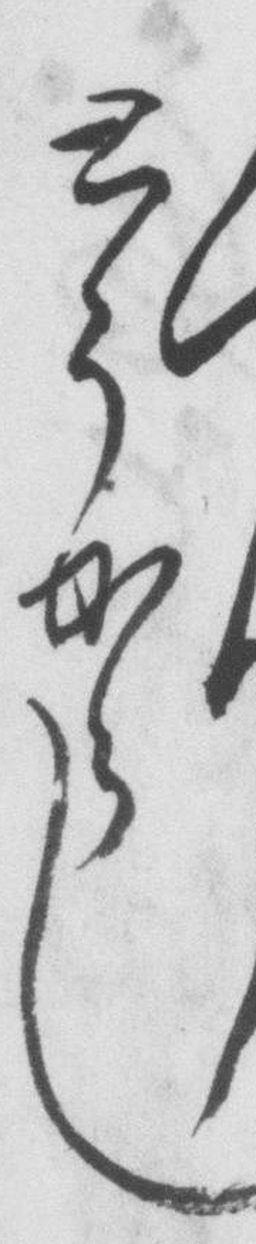とうからし
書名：料理筌
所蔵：大阪府立大学学術情報センター 国文学研究資料館
